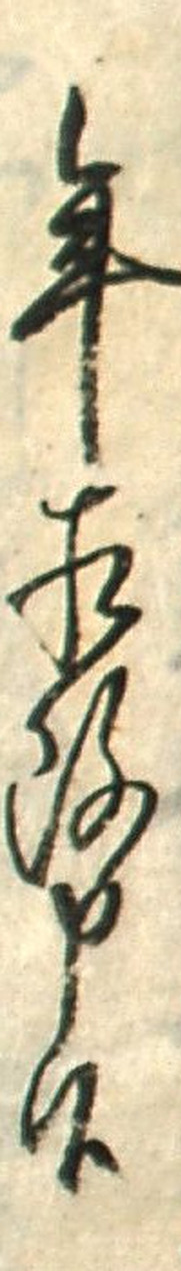年相改申候

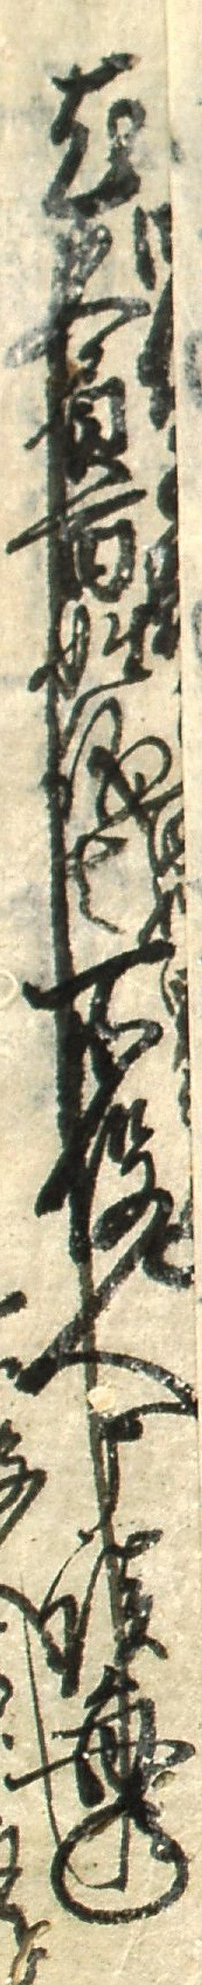尤夫負百姓儀者所役人申談毎年

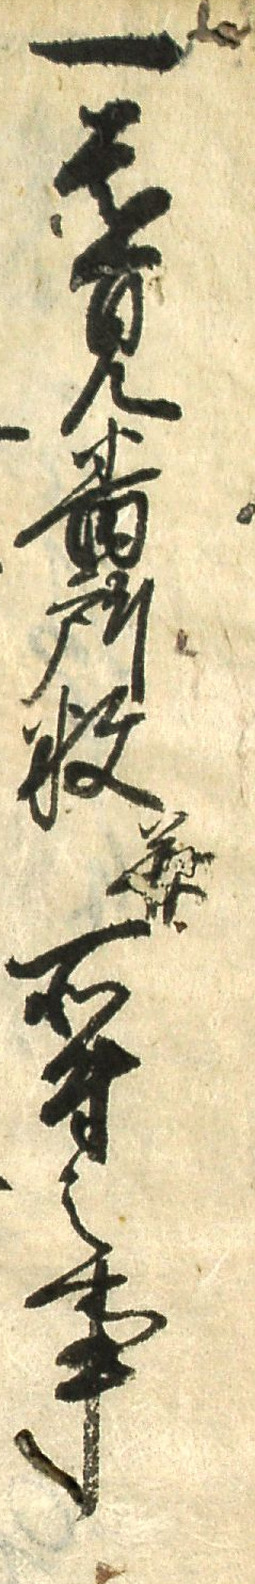一遠見番所数幷所付之事
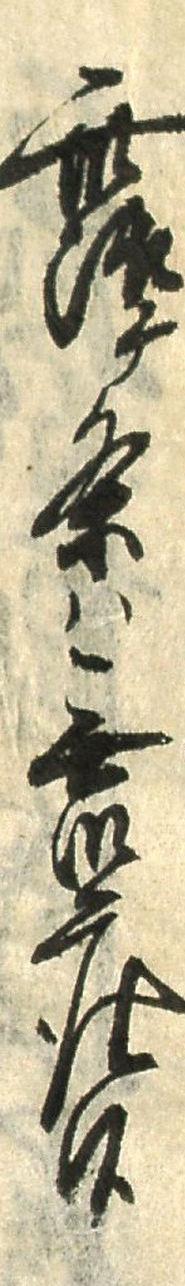此御ヶ条ハ無御座候
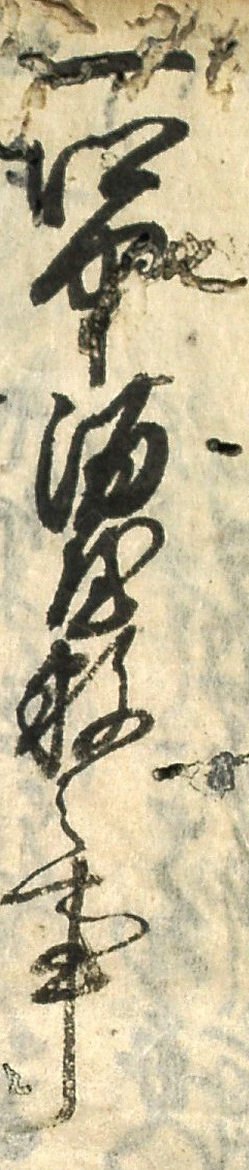一郷中酒屋数之事
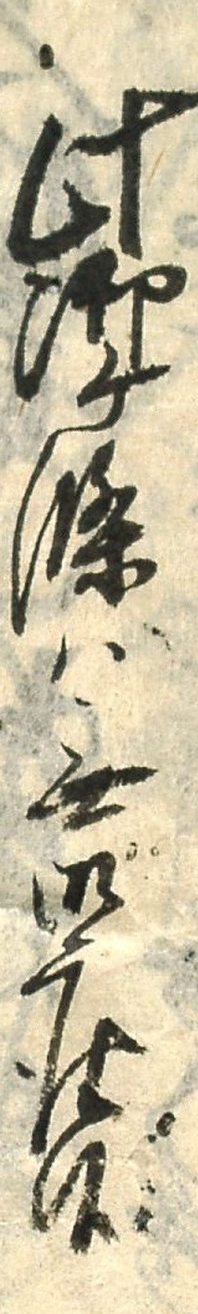此御ヶ條ハ無御座候
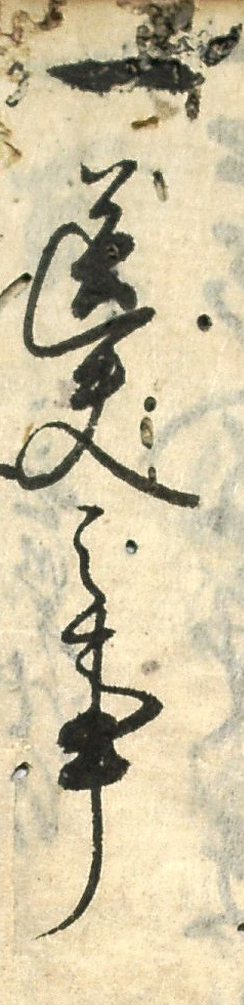一送夫之事
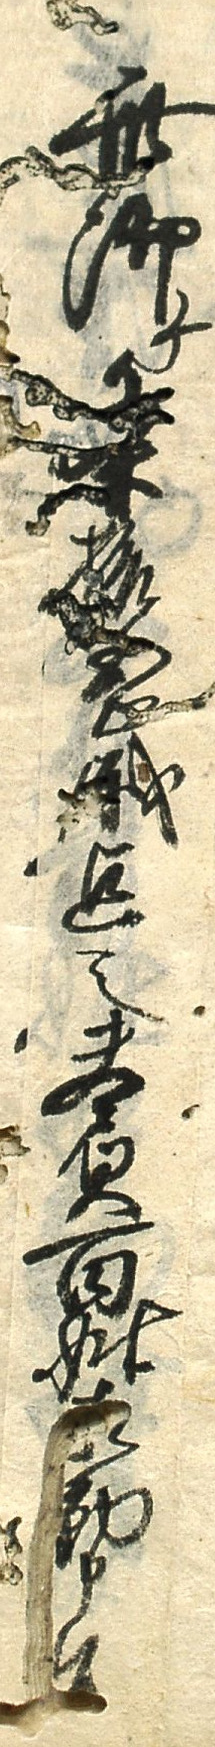此御ヶ條拾五歳迄之夫負百姓相勤申候
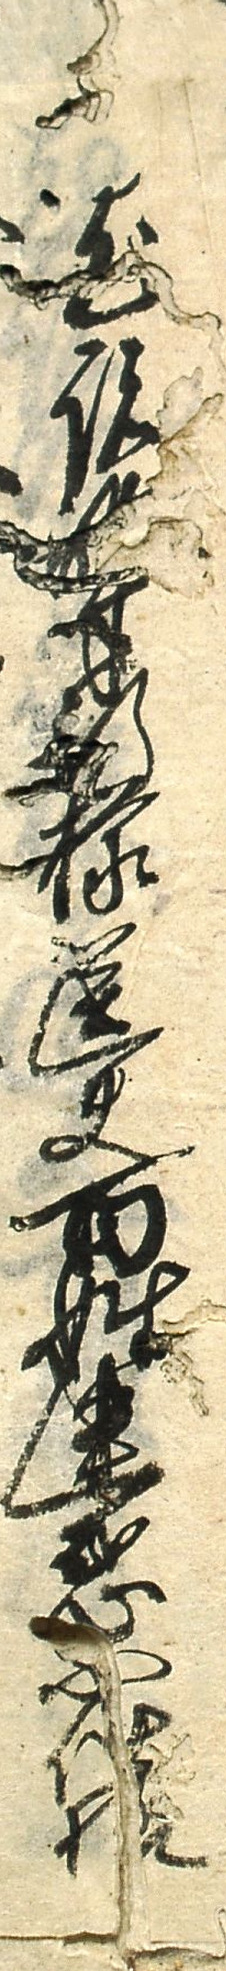尤諸御奉行様送夫百姓迷惑不仕様
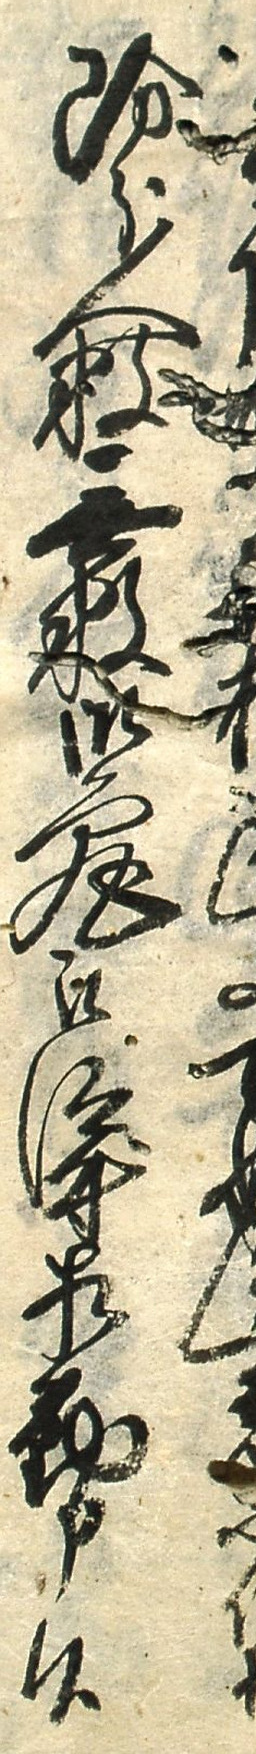随分人数無数御究被仰付相勤申候
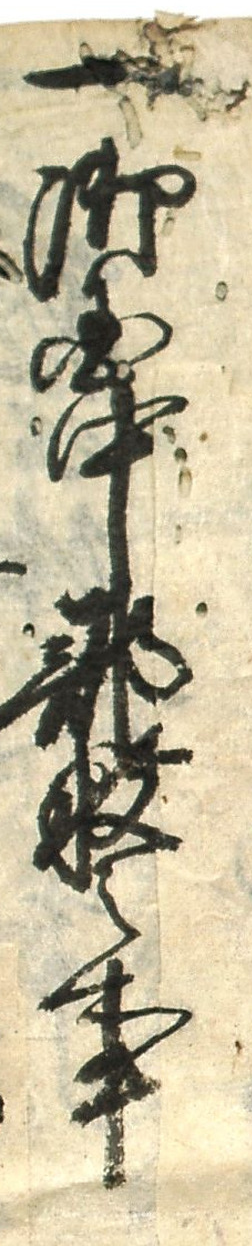一御国中郡数之事
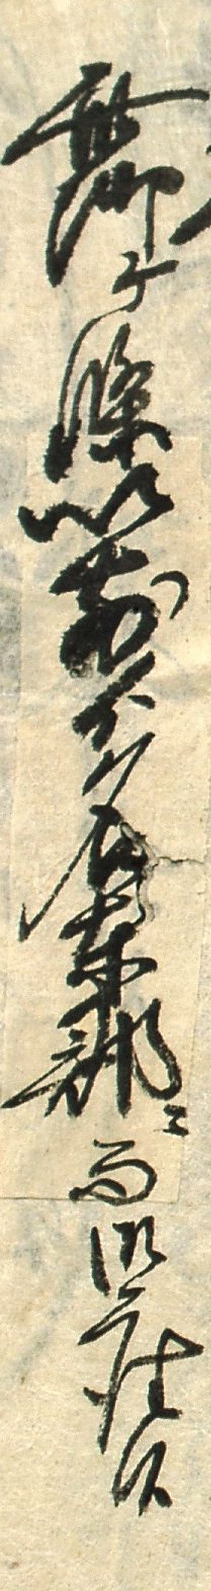此御ヶ條以前ゟ名東郡ニ而御座候
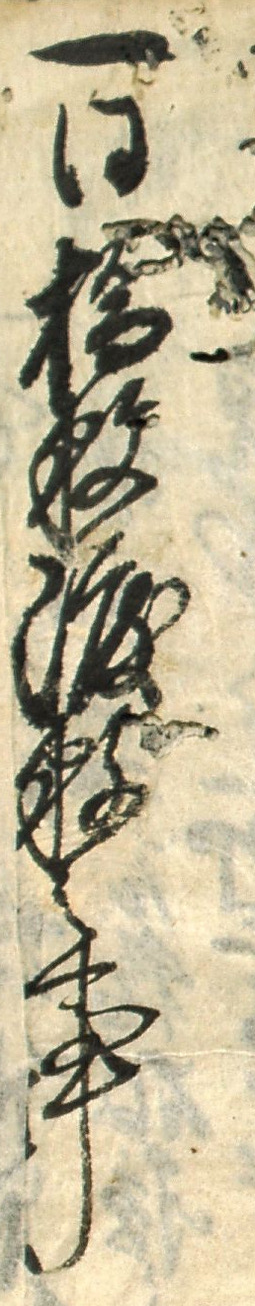一同橋数渡数之事
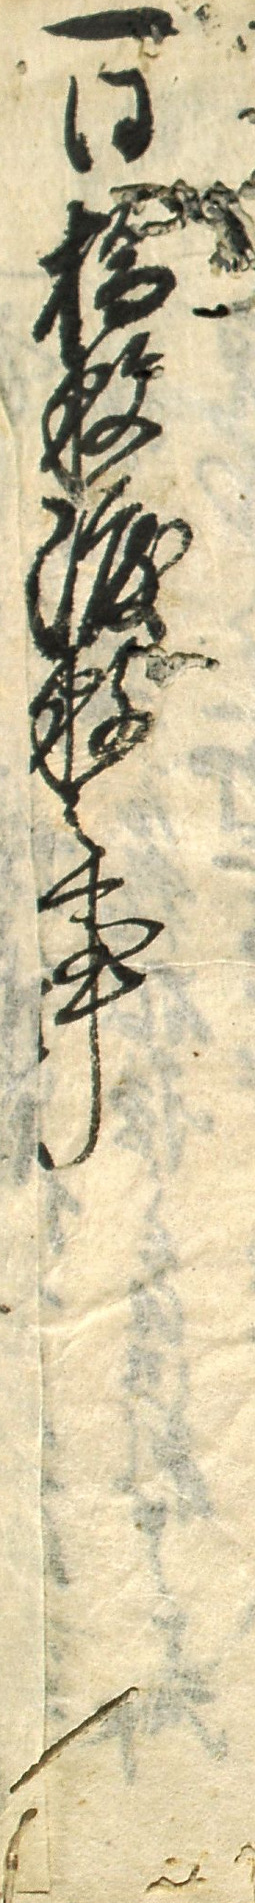一同橋数渡数之事
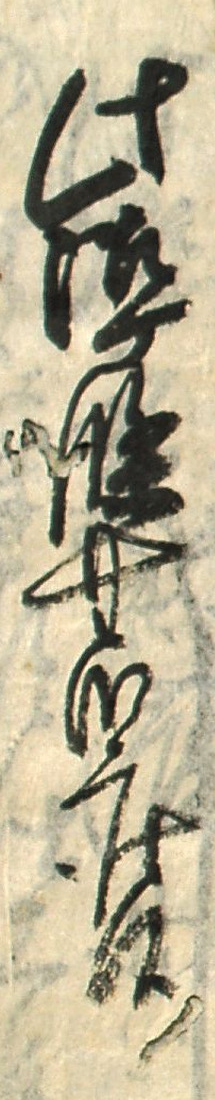此御ヶ條無御座候

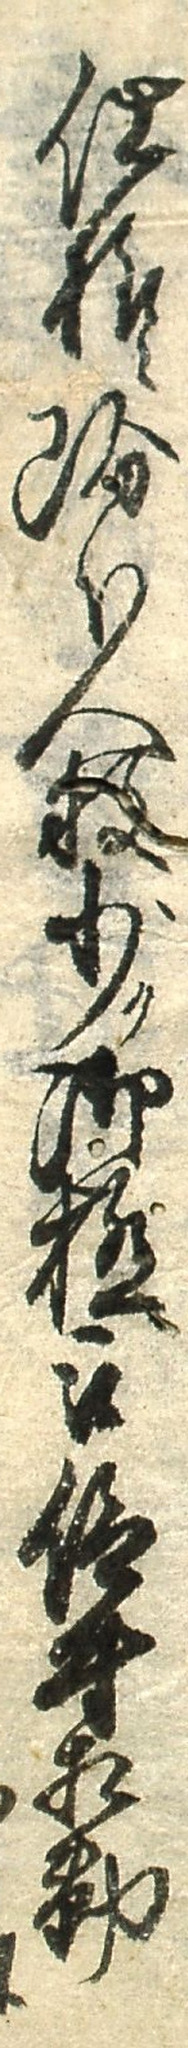仕様ニ随分人数少ク御極被仰付相勤申候
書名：御ヶ条ヲ以被仰附株々申上帳（早渕村控）
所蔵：鳴門教育大学 Naruto University of Education
